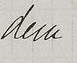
Vertrag
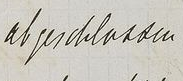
abgeschlossen u
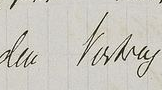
den Vertrag
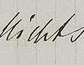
nachher
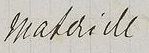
materiell
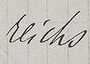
sei aber
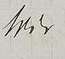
Leider
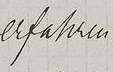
erfahren
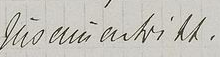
zusammentritt.
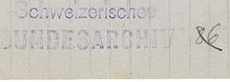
Meinung könnte
